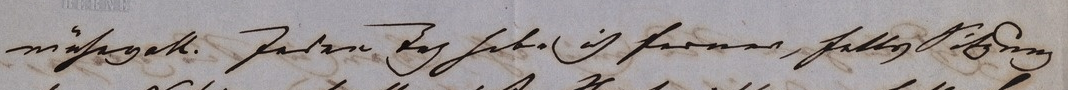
mühevoll. Jeden Tag habe ich ferner, falls Sitzung
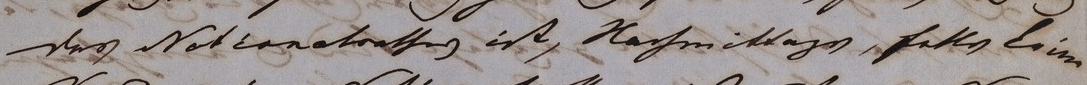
des Nationalrathes ist, Nachmittags, falls keine
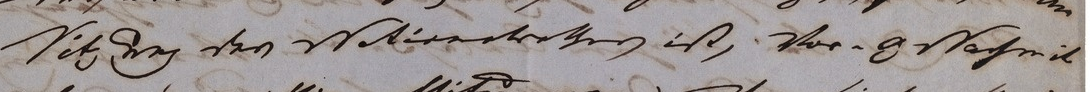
Sitzung des Nationalrathes ist, Vor- & Nachmit-
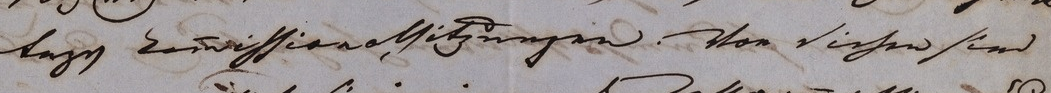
tags Commissionalsitzungen. Von diesen sind
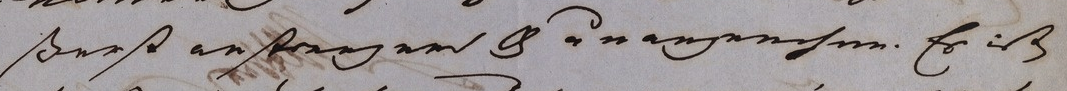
ßerst anstrengend & unangenehm. Es ist
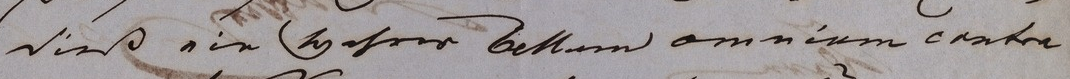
dieß ein wahrer Bellum omnium contra
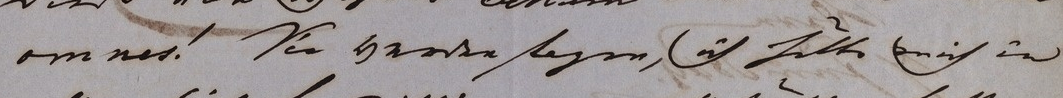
omnes! Sie werden sagen, ich hätte mich in
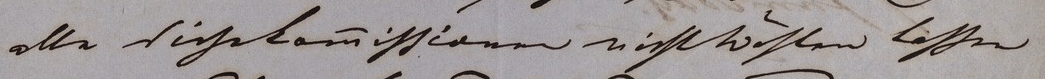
alle diese Commissionen nicht wählen lassen
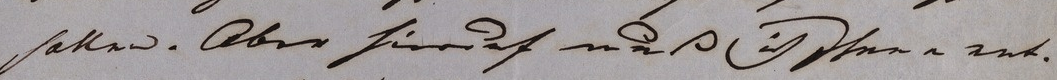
sollen. Aber hierauf muß ich Ihnen ent-
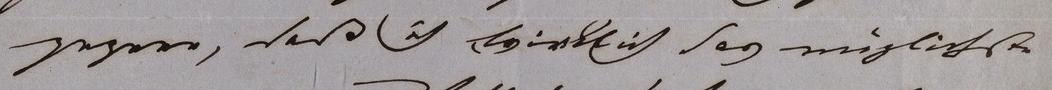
gegnen, daß ich wirklich das möglichste
